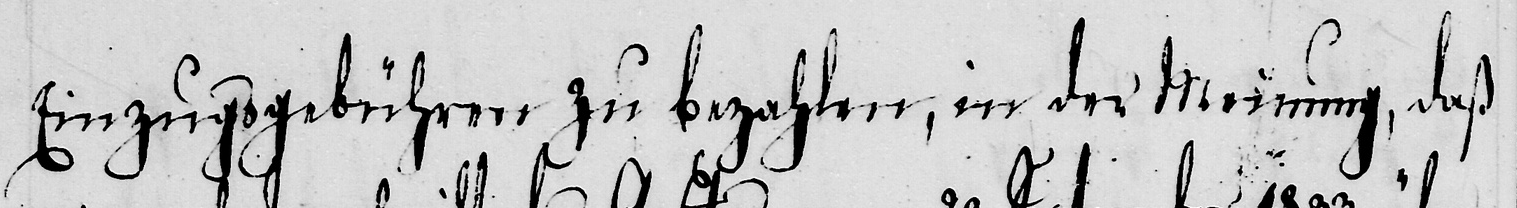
Einzugsgebühren zu bezahlen, in der Meinung, daß
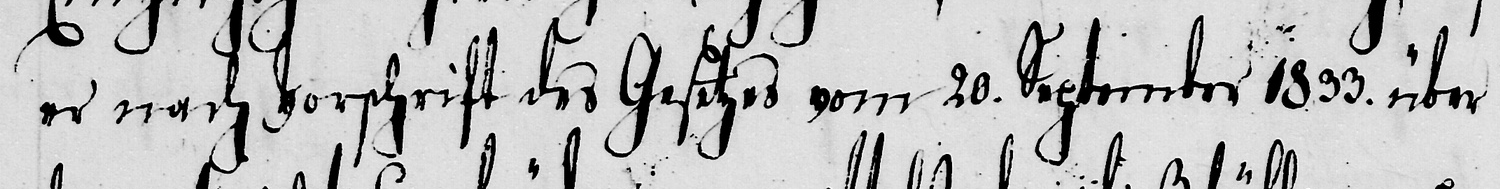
er nach Vorschrift des Gesetzes vom 20. September 1833. über
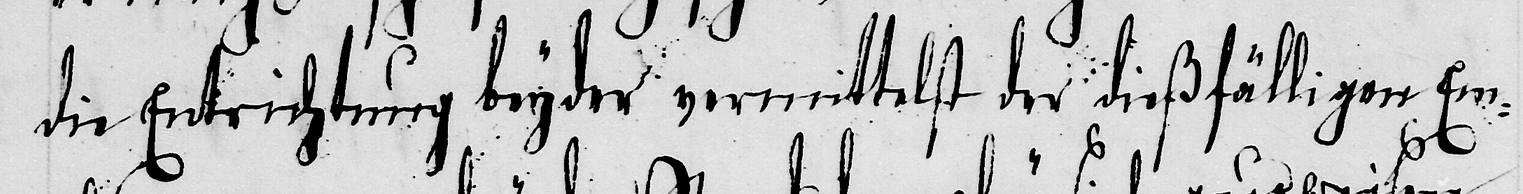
die Entrichtung beyder vermittelst der dießfälligen Em¬
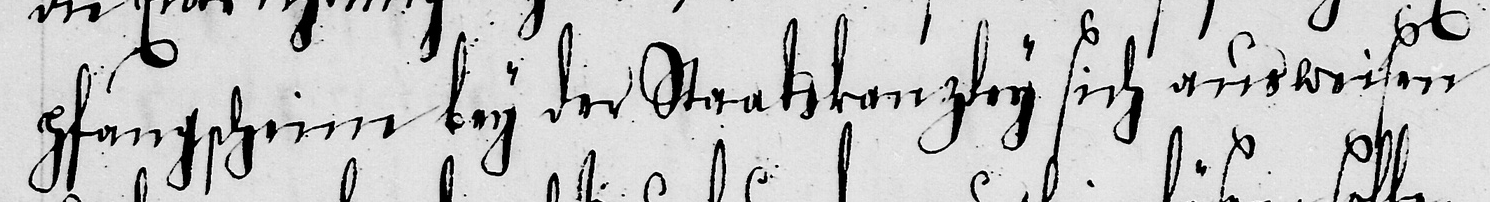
pfangschein bey der Staatskanzley sich ausweisen
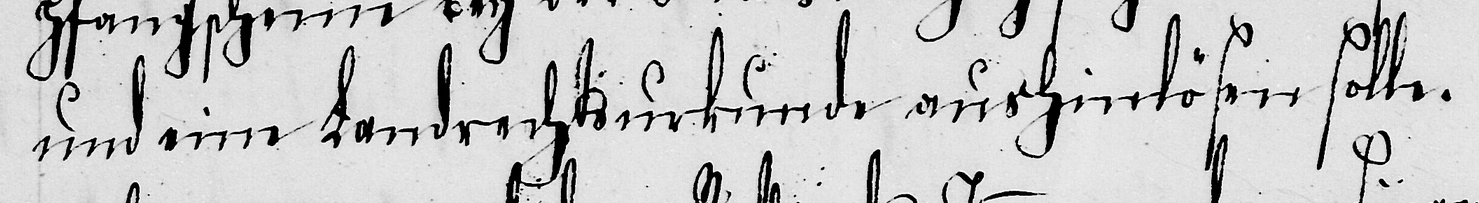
und eine Landrechtsurkunde aushinlösen solle.
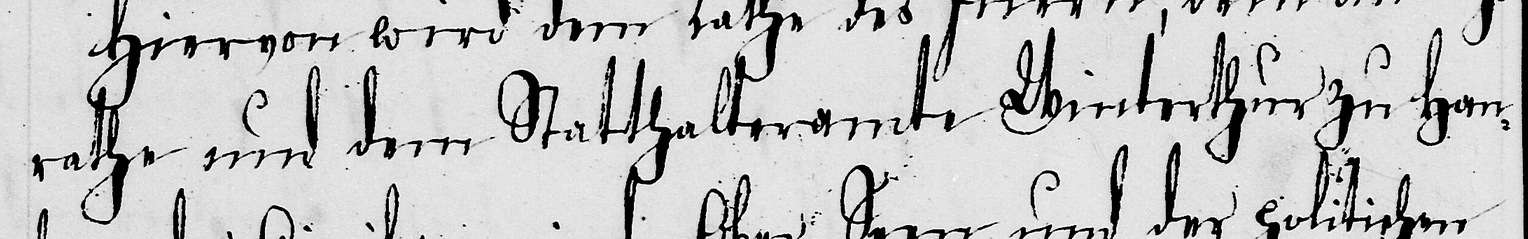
rathe und dem Statthalteramte Winterthur zu Han¬
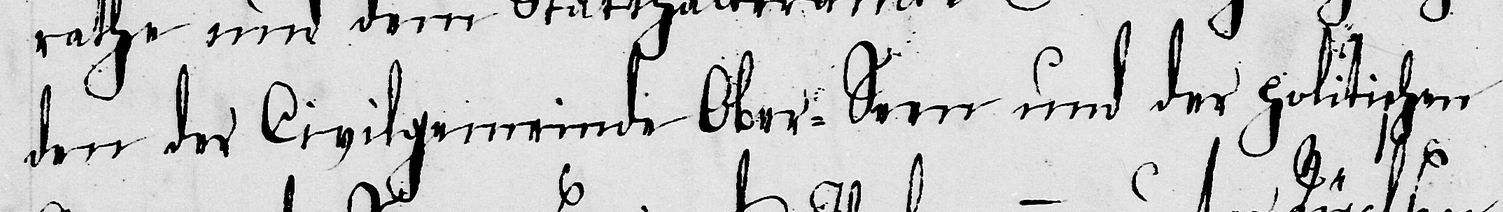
den der Civilgemeinde Ober-Seen und der politischen
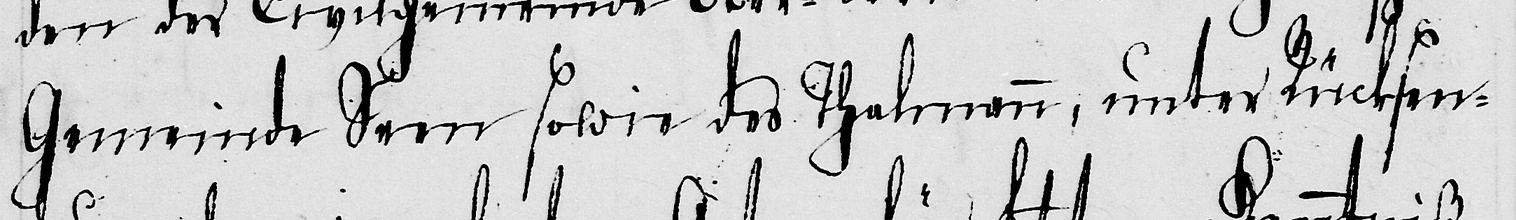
Gemeinde Seen sowie des Thalmann, unter Rücksen¬
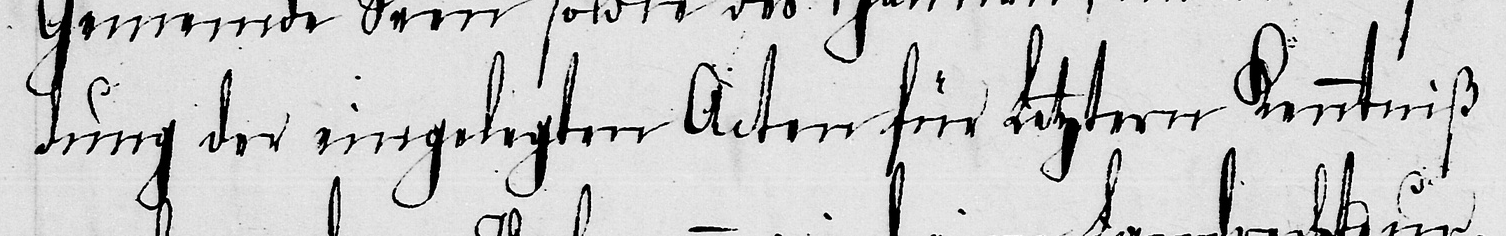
dung der eingelegten Acten für Letztern Kenntniß
